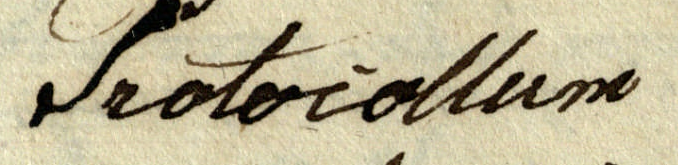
Protocollum
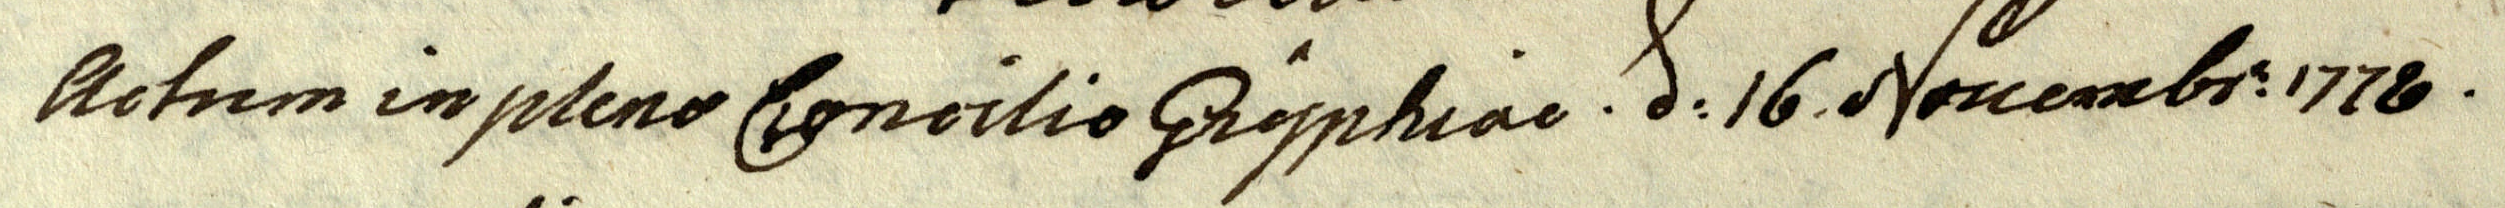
Actum in pleno Concilio Grÿphiae d. 16. Novembr. 1778.
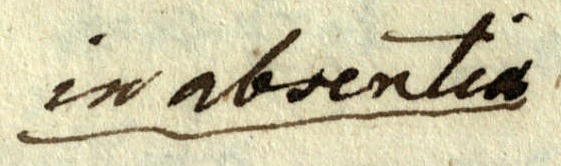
in absentia
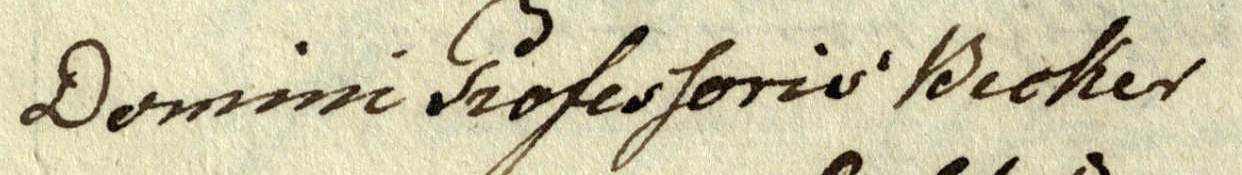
Domini Professoris Becker
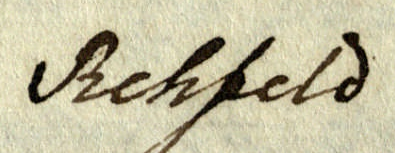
Rehfeld
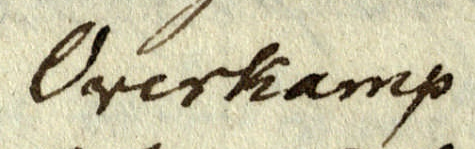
Overkamp
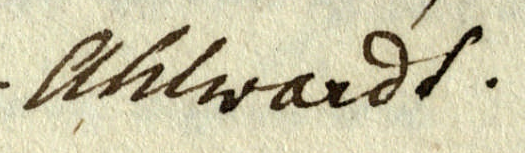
Ahlwardt.
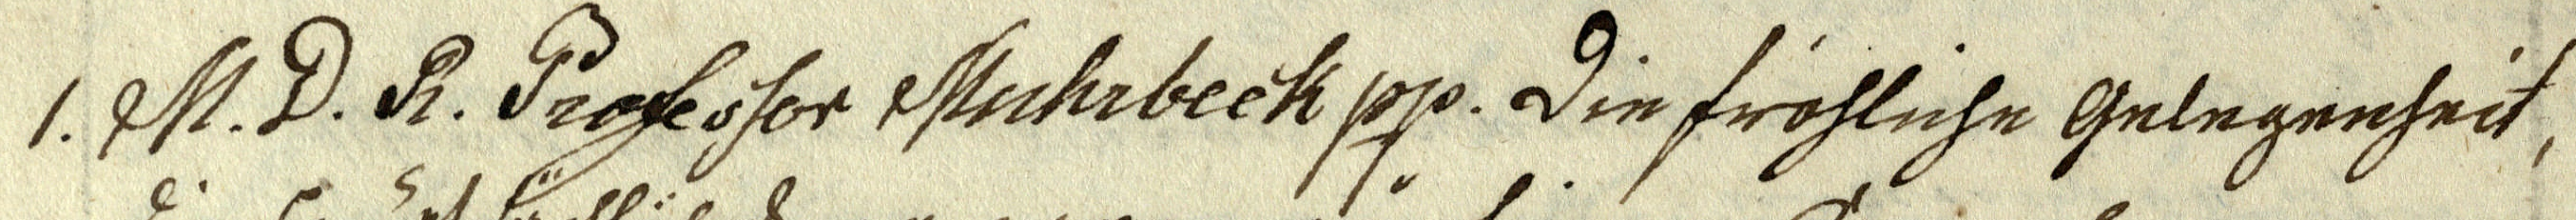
1. M. D. R. Professor Muhrbeck pp. Die fröhliche Gelegenheit,
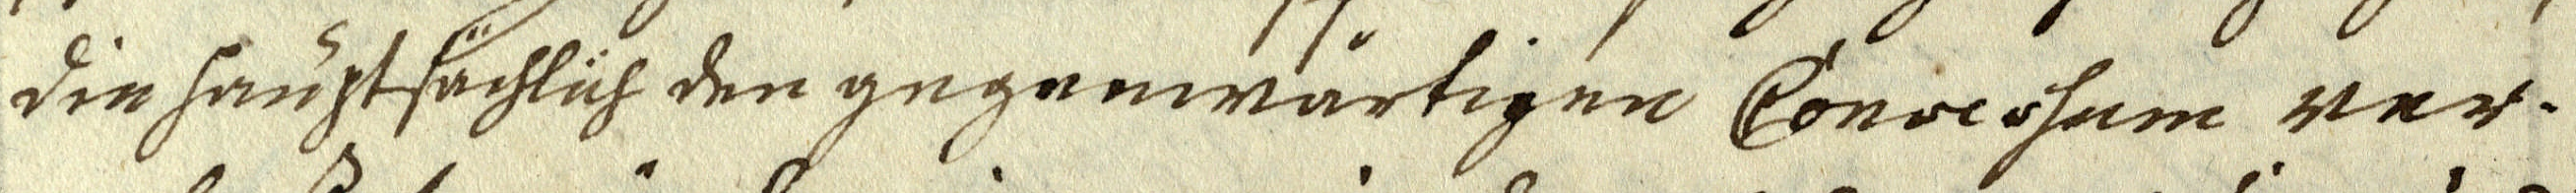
die hauptsächlich den gegenwärtigen Consessum ver¬
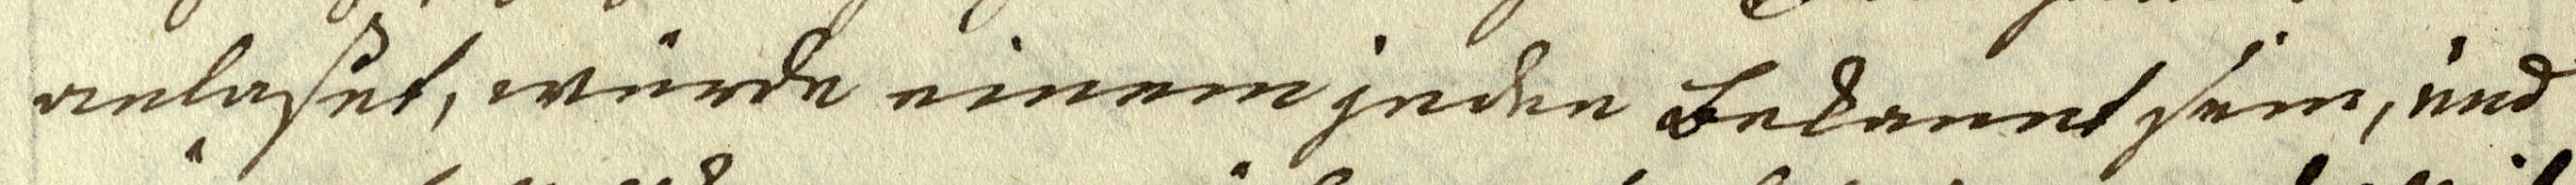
anlaßet, würde einem jeden bekannt sein, und
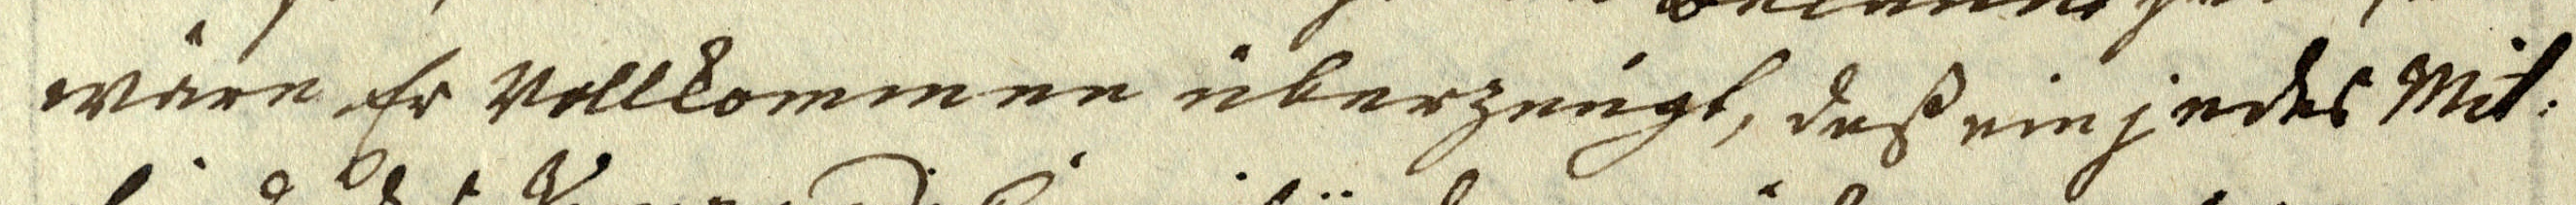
wäre Er vollkommen überzeugt, daß ein jedes Mit¬
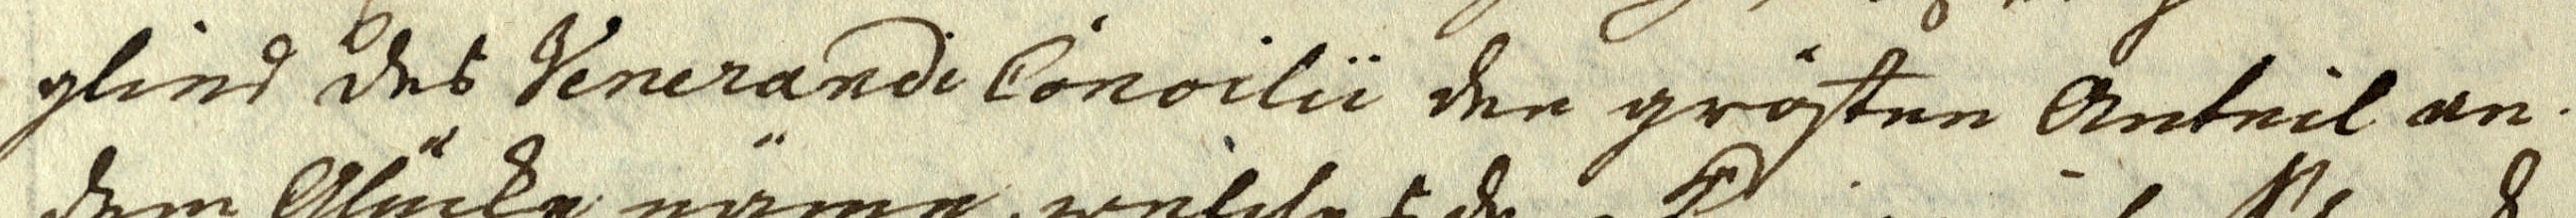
glied des Venerandi Concilii den grösten Anteil an
